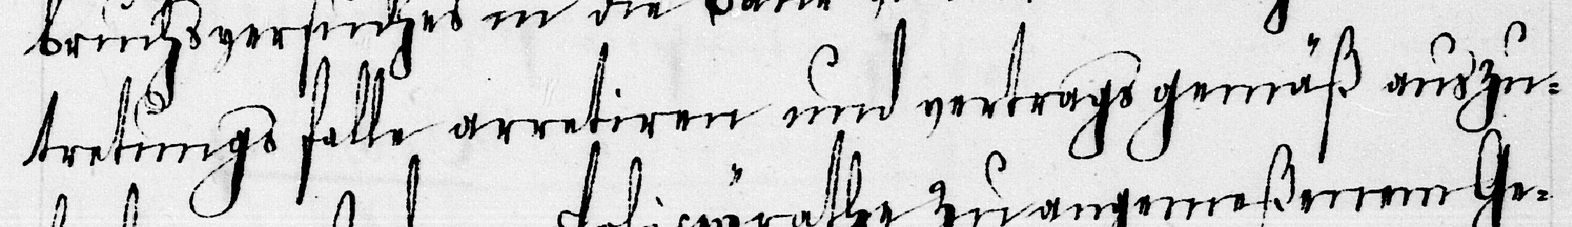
tretungsfalle arretiren und vertragsgemäß auszu¬
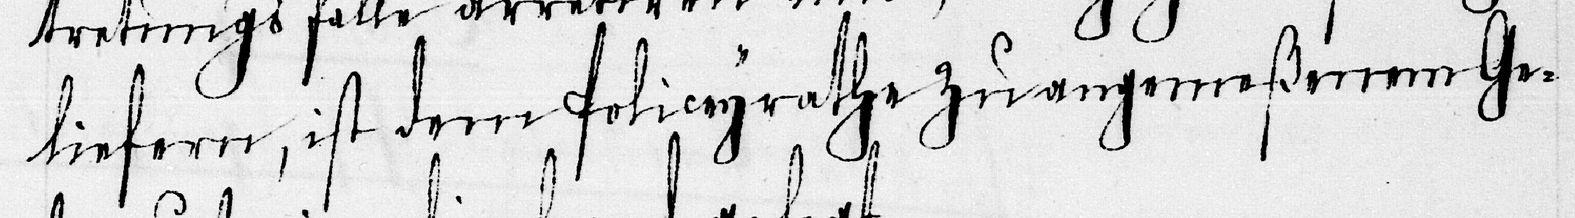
liefern, ist dem Policeyrathe zu angemeßenen Ge¬
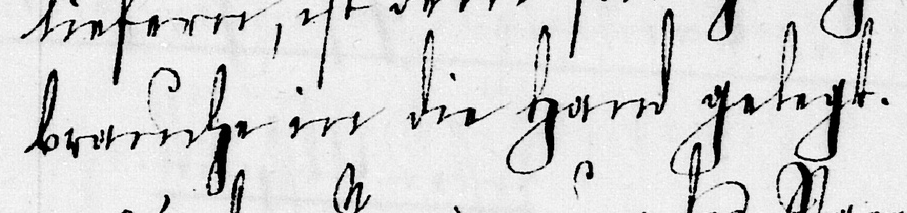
brauche in die Hand gelegt.
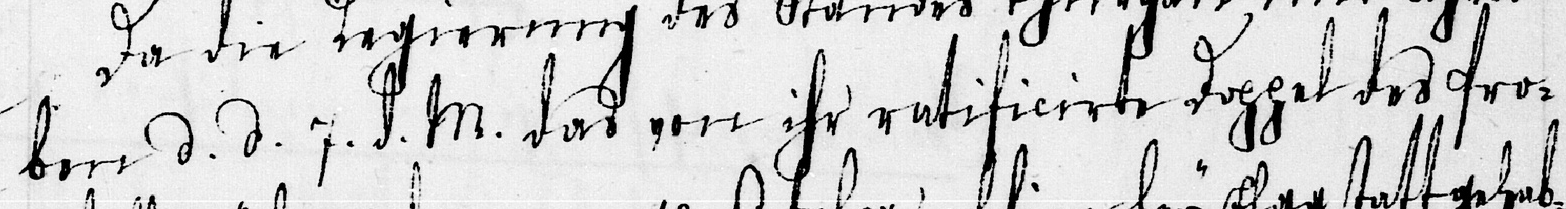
ben d. d. 7. d. M. das von ihr ratificirte Doppel des Pro¬
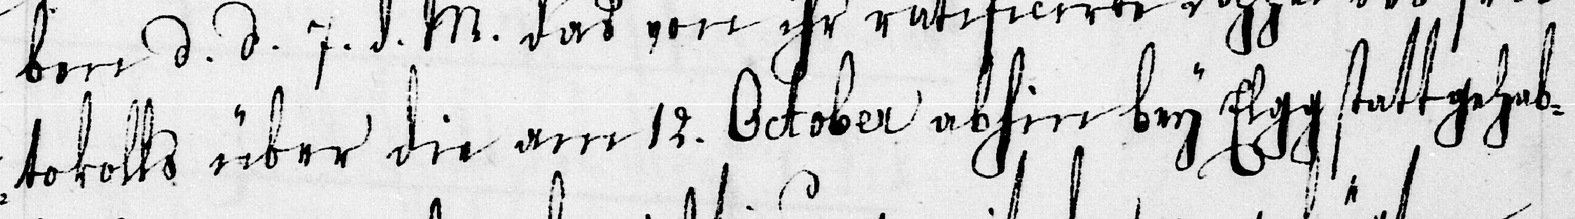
tokolls über die am 12. October abhin bey Elgg stattgehab¬
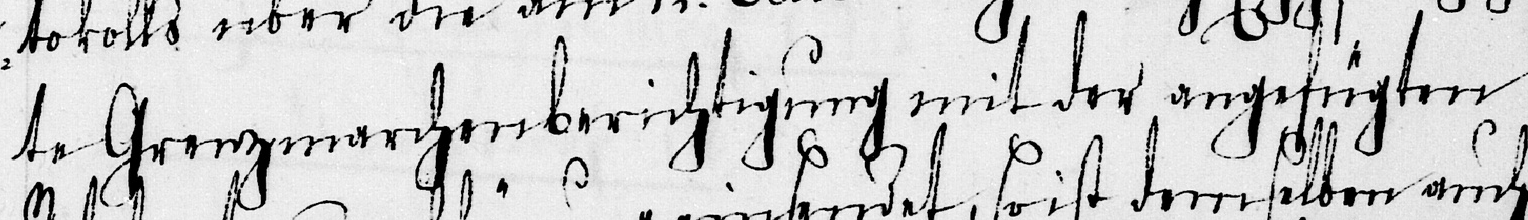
te Grenzmarchenberichtigung mit der angefügten
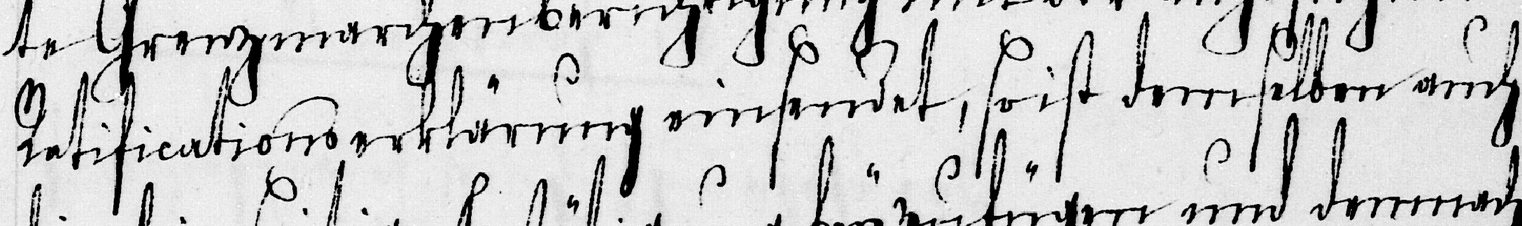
Ratificationserklärung einsendet, so ist demselben auch
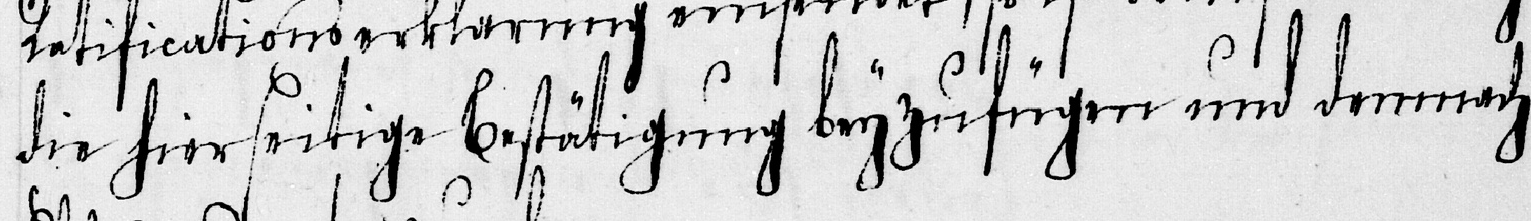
die hierseitige Bestätigung beyzufügen und demnach
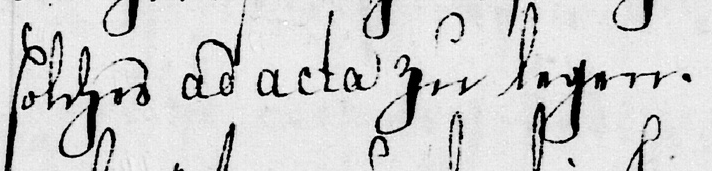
solches ad acta zu legen.
